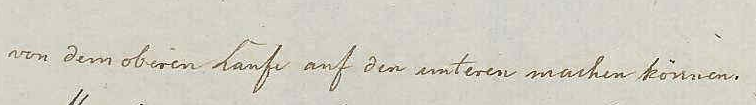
von dem oberen Laufe auf den unteren machen können.
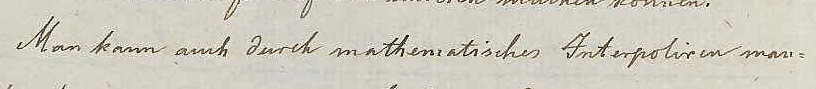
Man kann auch durch mathematisches Interpoliren man-
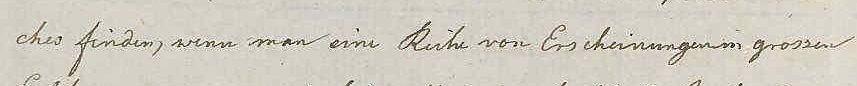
ches finden, wenn man eine Reihe von Erscheinungen in grossen
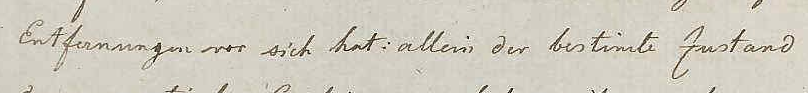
Entfernungen vor sich hat: allein der bestimte Zustand
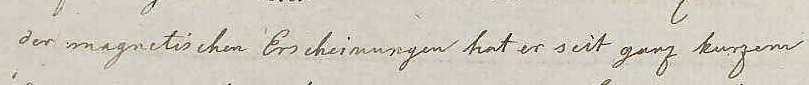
der magnetischen Erscheinungen hat seit ganz kurzem
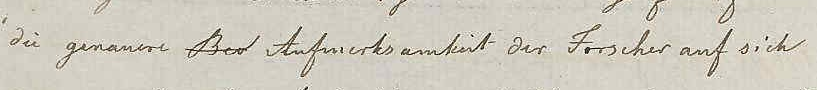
die genauere BeoAufmerksamkeit der Forscher auf sich
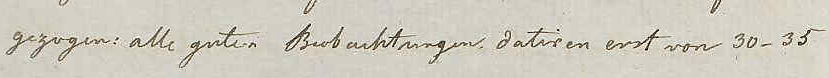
gezogen: alle guten Beobachtungen datiren erst von 30–35
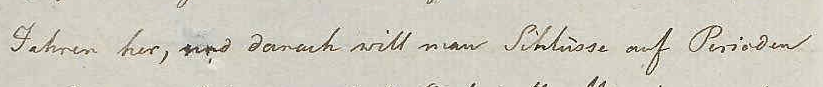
Jahren her, und danach will man Schlüsse auf Perioden
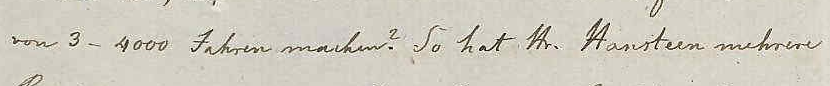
von 3–4000 Jahren machen? So hat Hr. Hansteen mehrere
